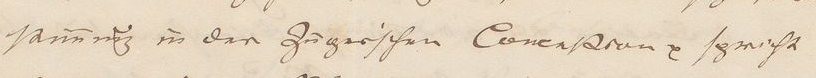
stimmung in der Zugerischen Conceßion & spricht
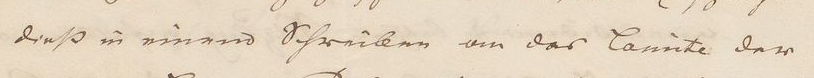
dieß in einem Schreiben an das Comite der
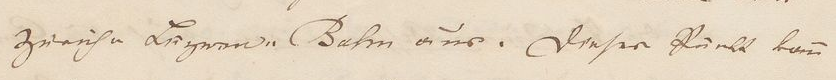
Zürich-Luzern-Bahn aus. Dieser Punkt kann
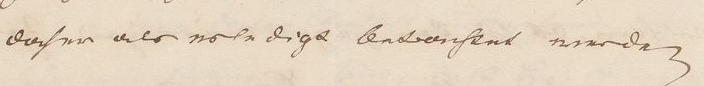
daher als erledigt betrachtet werden
